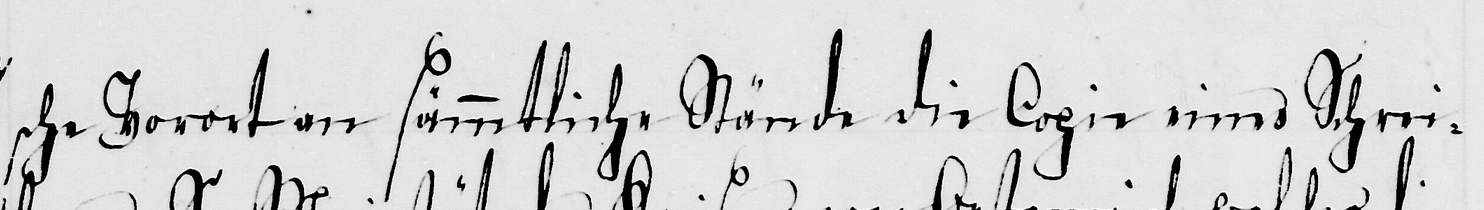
sche Vorort an sämmtliche Stände die Copie eines Schreibe¬
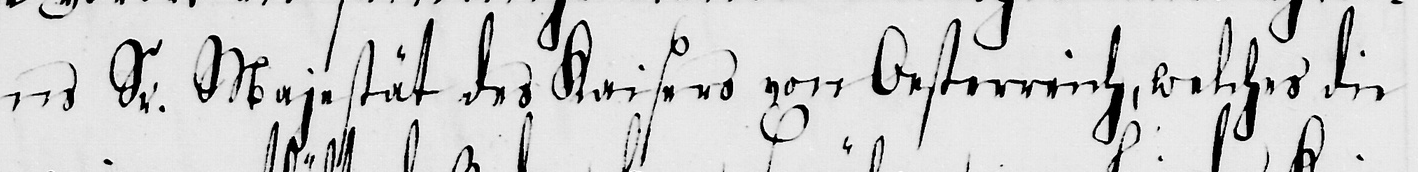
ns Sr. Majestät des Kaisers von Oesterreich, welches die
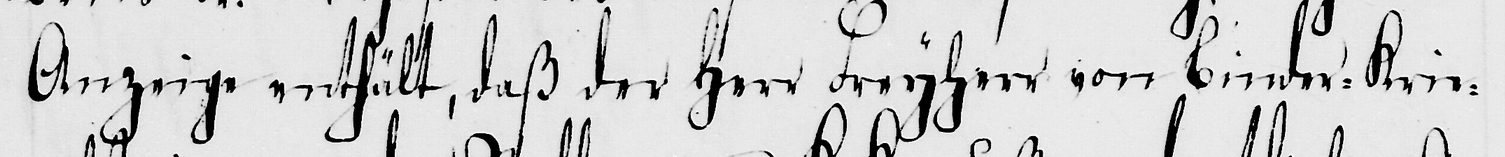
Anzeige enthält, daß der Herr Freyherr von Binder-Krie¬
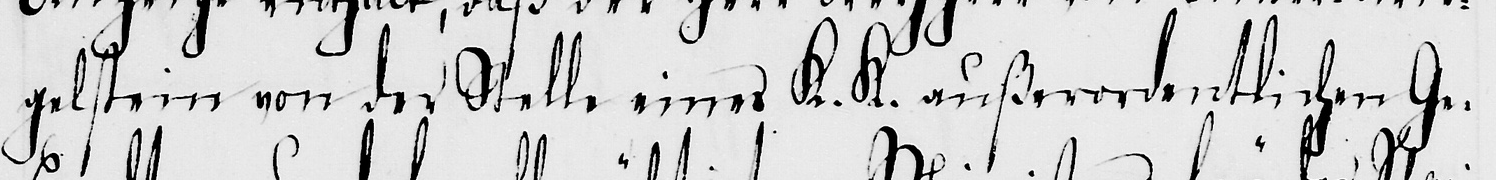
gelstein von der Stelle eines K. K. außerordentlichen Ge¬
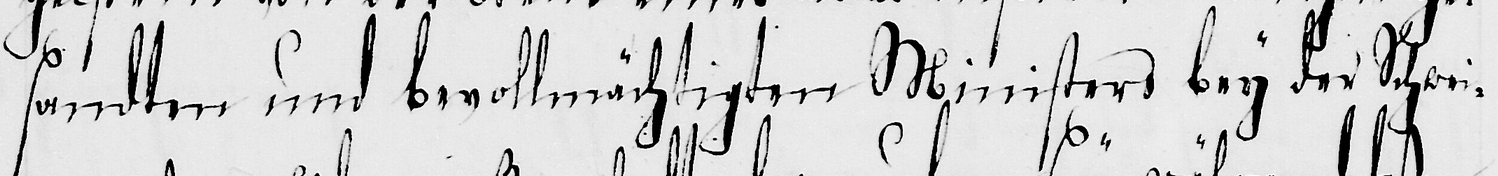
sandten und bevollmächtigten Ministers bey der Schwei¬
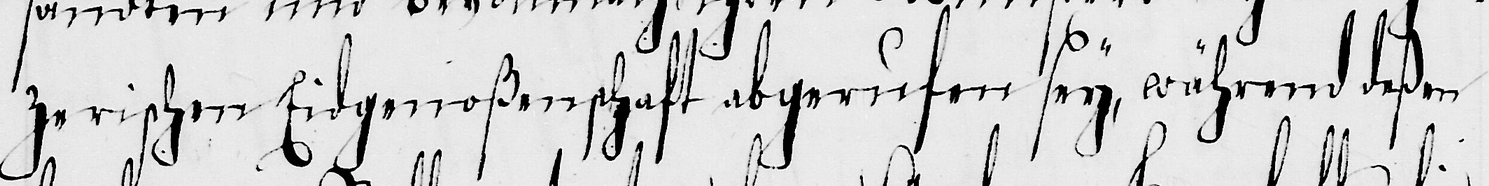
zerischen Eidgenoßenschaft abgerufen sey, während deßen
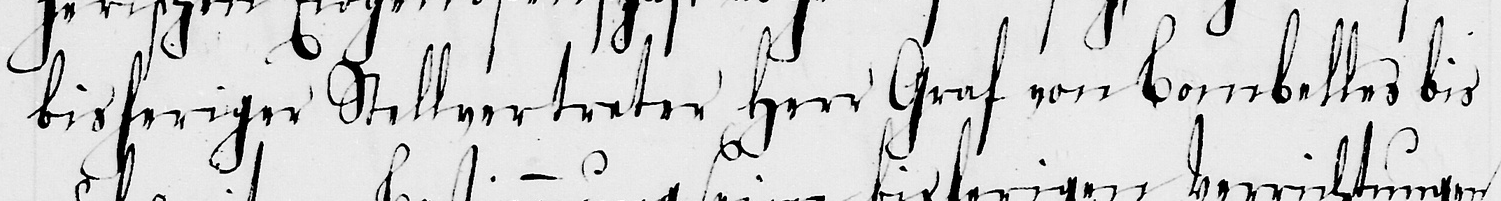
bisheriger Stellvertreter Herr Graf von Bombelles bis
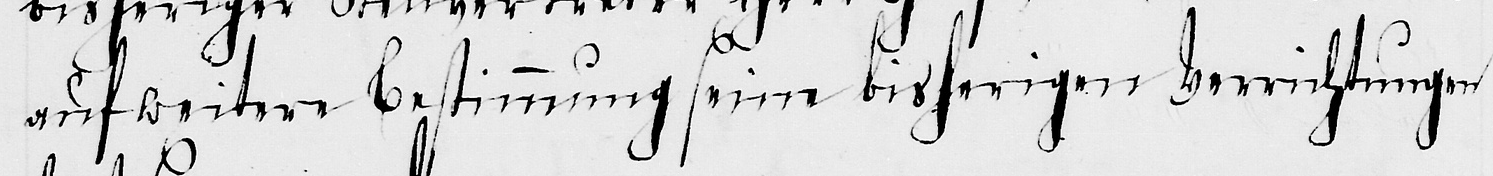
auf weitere Bestimmung seine bisherigen Verrichtungen
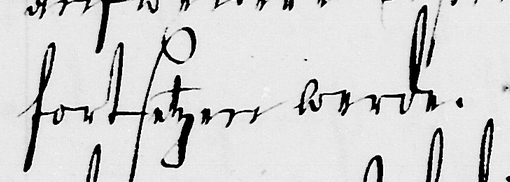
fortsetzen werde.
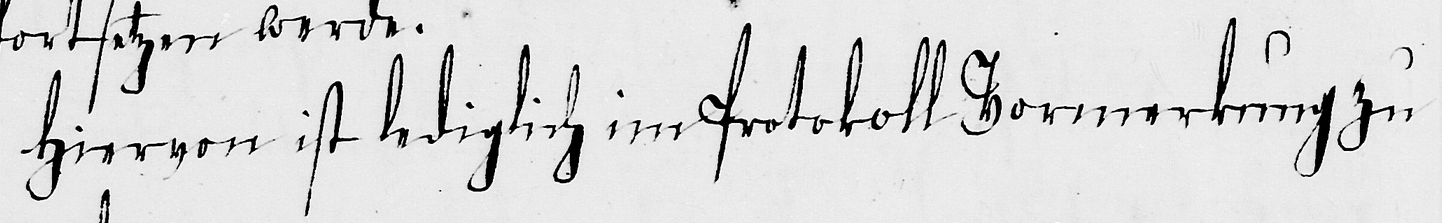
Hiervon ist lediglich im Protokoll Vormerkung zu
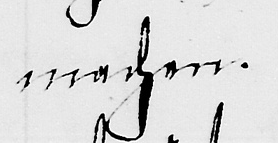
machen.
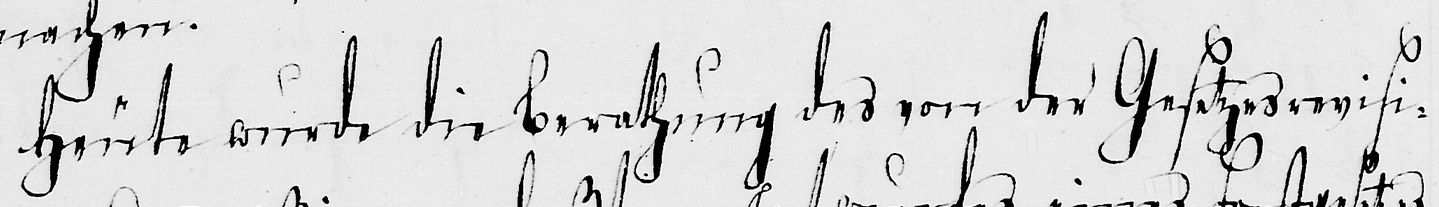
Heute wurde die Berathung des von der Gesetzesrevis¬
